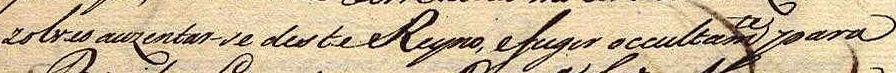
zolveo auzentar-se deste Reyno, e fugir occultamte para
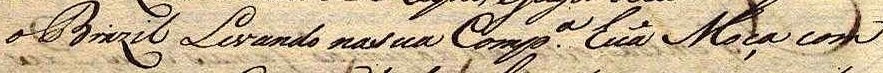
o Brazil Levando na sua Comp.a huā Moça com
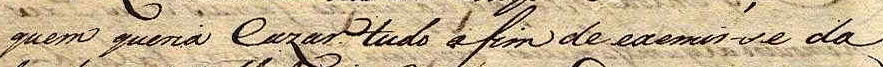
quem queria Cazar tudo afim de exemir-se da
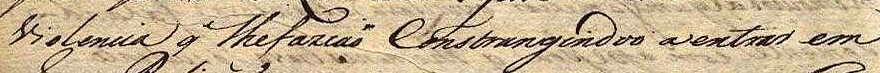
violencia q̄ lhe faziaõ Constrangindoo a entrar em
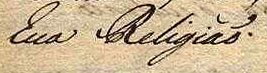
hua Religiaõ.
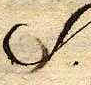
I.
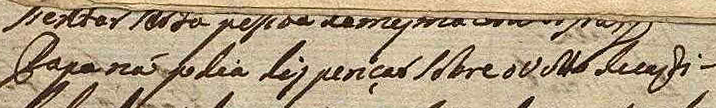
Papa naõ podia dispençar sobre o velho de casti
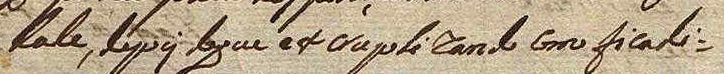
dade, depois do que excrupoliZando como fica di
